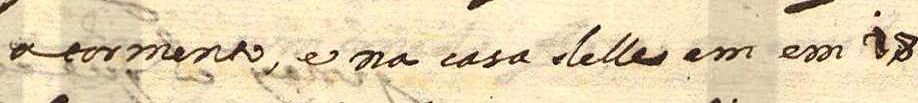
a tormento, e na casa delle em em 18
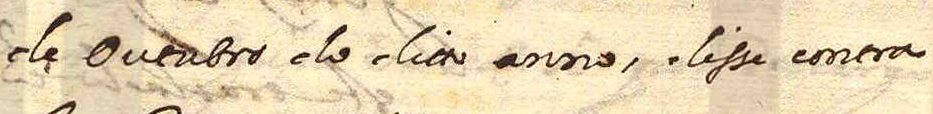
de Outubro do ditto anno, disse contra
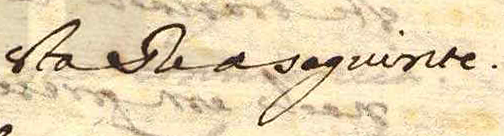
esta Re a seguinte.
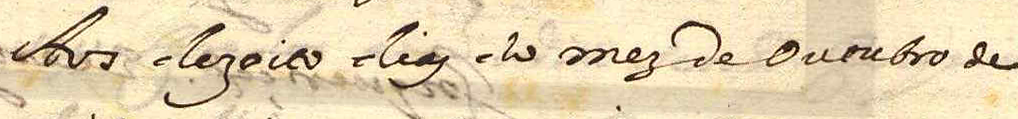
Aos dezoito dias do mez de Outubro de
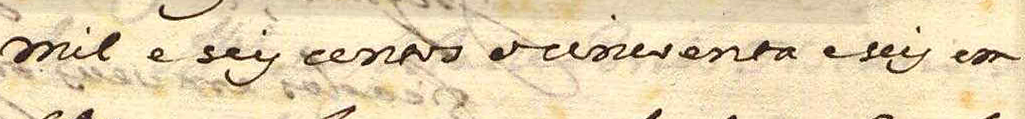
mil e seiscentos e cincoenta e seis em
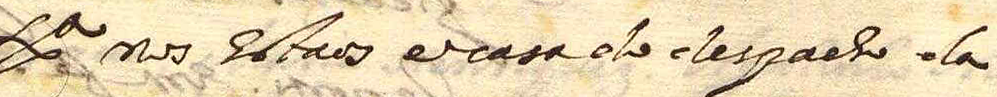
Lxa nos Estaos e casa do despacho da
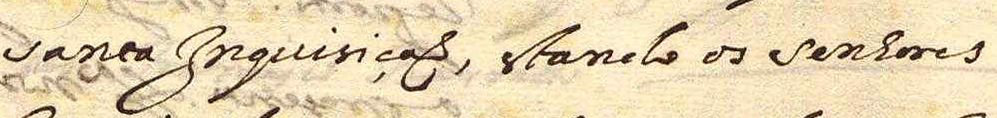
santa Jnquisiçaõ, estando os senhores
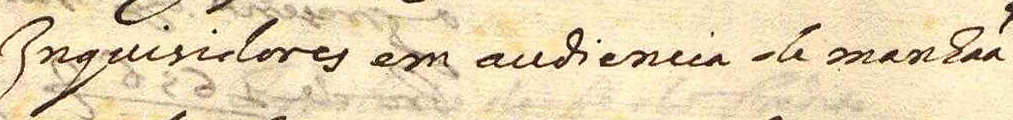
Jnquisidores em audiencia de manhaã
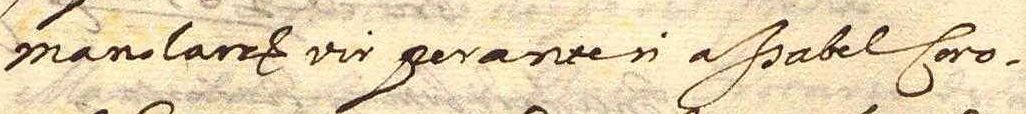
mandaraõ vir perante si a Jsabel Coro
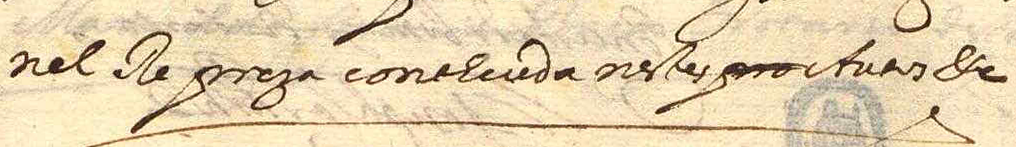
nel Re preza contheuda nestes pro Autos &c
